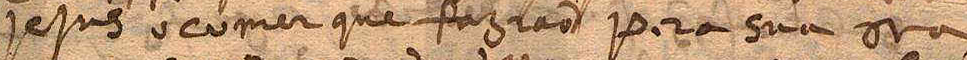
JeJus o comer que faziaõ pera sua sea
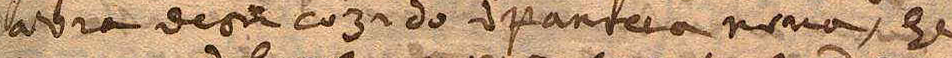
avia de ser cozido ē panella noua / he
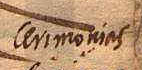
Cerimonias
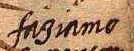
faziam o
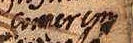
comer em
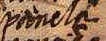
panela
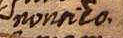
noua E o
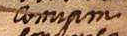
comiam
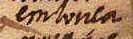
em louça
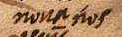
noua nos
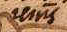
ieiūs
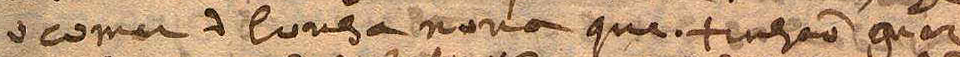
o comer ē lousa noua que. tinhaõ guar
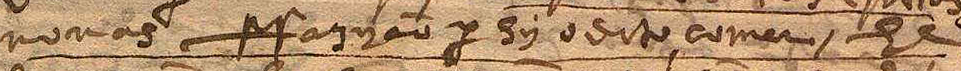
nouas ffazyão ꝑ sy o dito comer / he
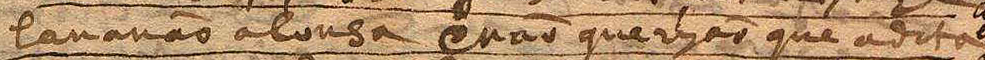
lauauão a lousa e naõ queryaõ que a dita
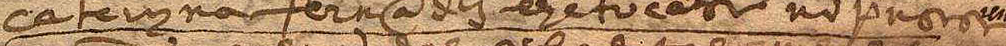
cateryna fernādez lhe tocase nē pusese
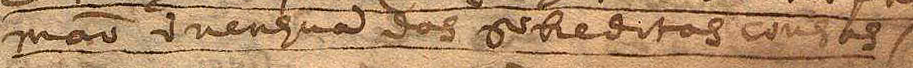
mão ē nenhuā das sobreditas cousas /
